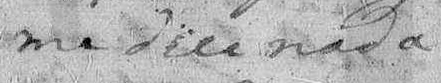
me dice nada
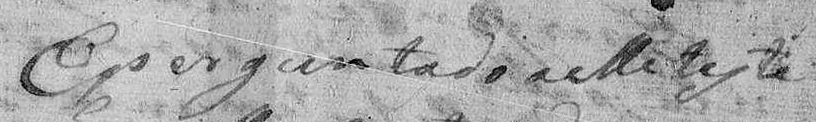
E perguntado a elle teste
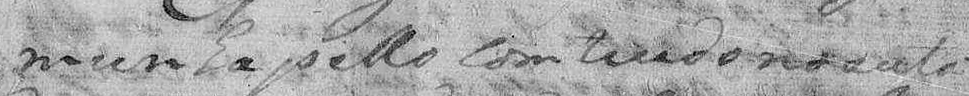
munha pello comteudo no auto
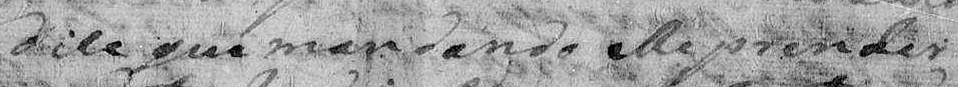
dice que mandando elle prender
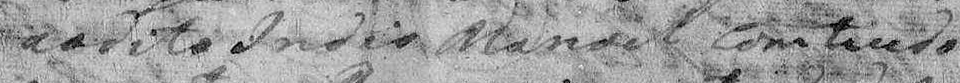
ao dito Indio Manoel Conteudo
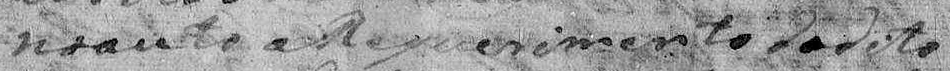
no auto e Requerimento do dito
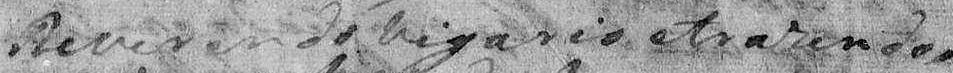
Reverendo vigario e trazendo o
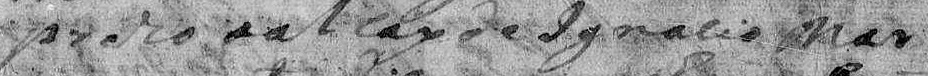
prezo o alcayde Ignacio Mar
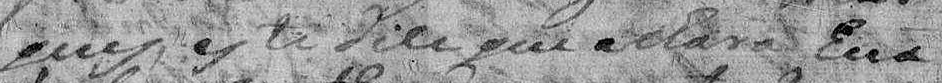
ques, este dice que achara hua
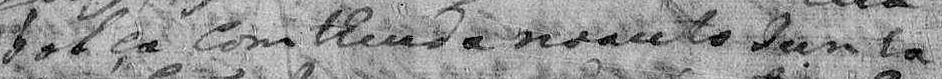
bolça comtheuda no auto Iunta
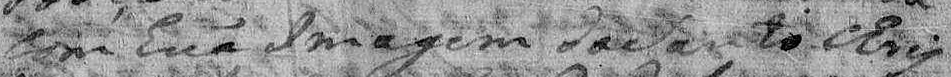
com huā Imagem do Santo Chris
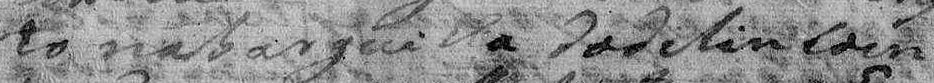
to na barguilha do delincoen
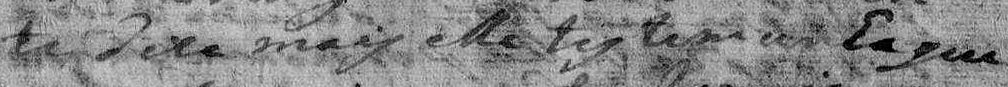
te dice mais elle testemunha que
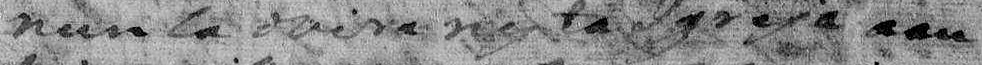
nunca o vira nesta Igreja a ou
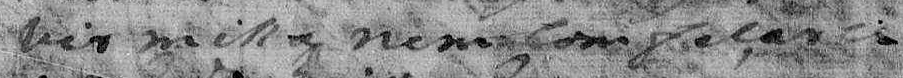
vir missa nem comfeçarce
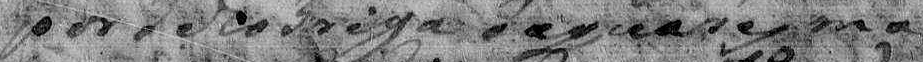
por dezobriga da quaresma
